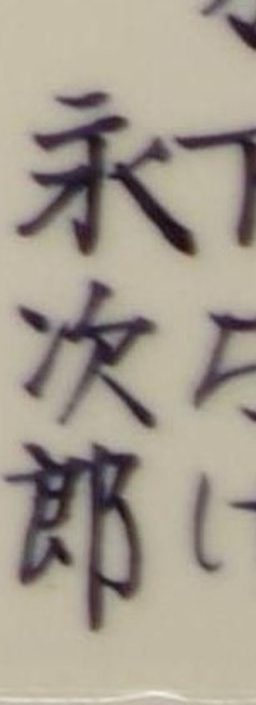永次郎
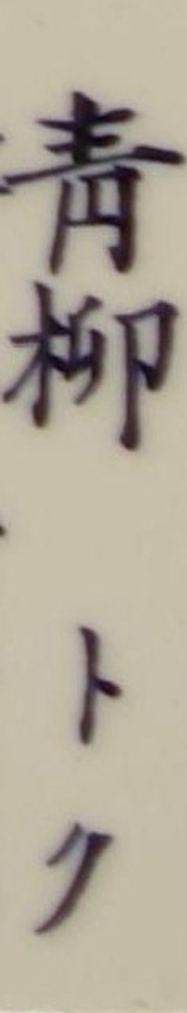青柳トク
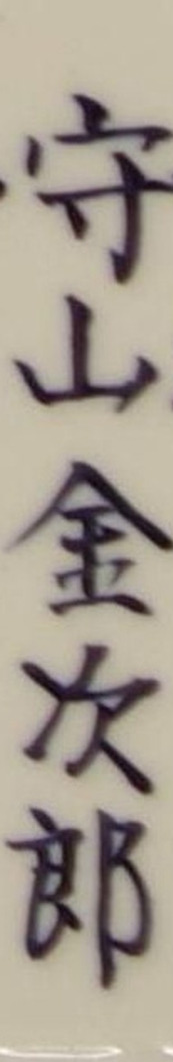守山金次郎
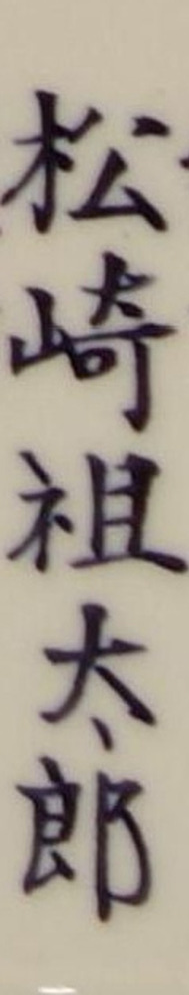松崎祖太郎
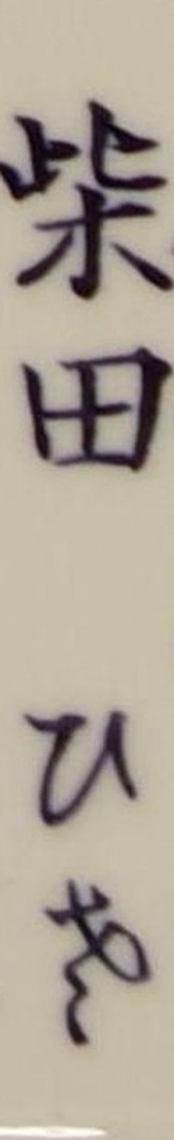柴田ひさ
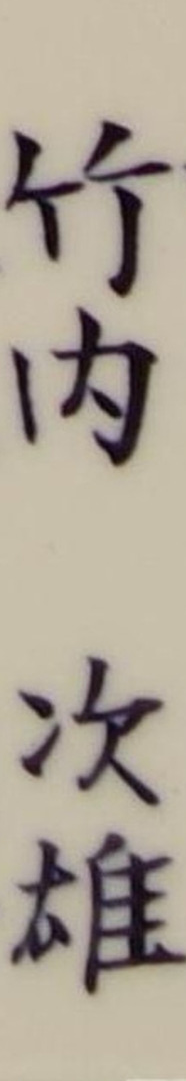竹内次雄
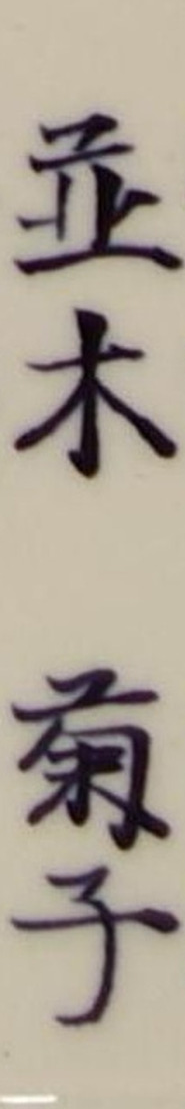並木菊子
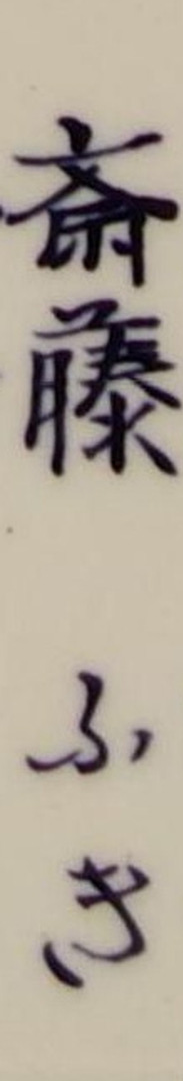斎藤ふき
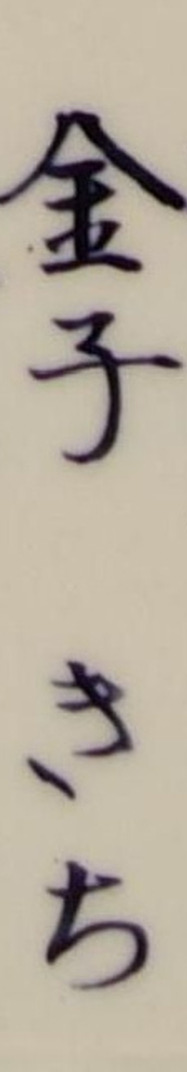金子きち
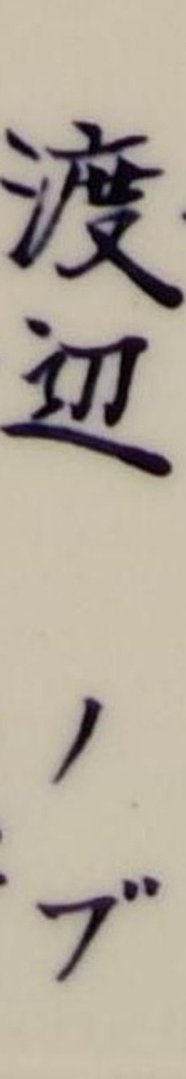渡辺ノブ
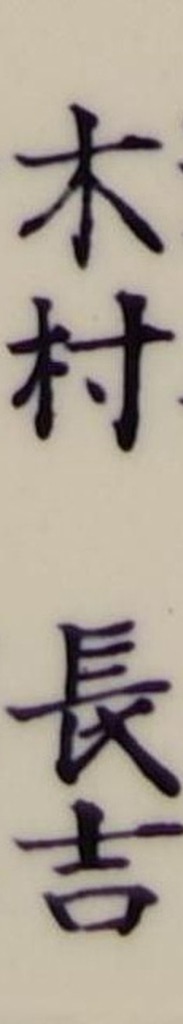木村長吉
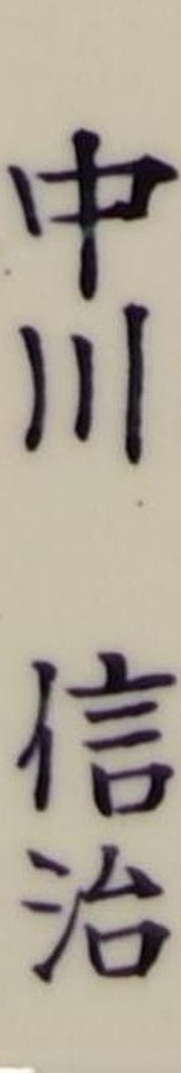中川信治
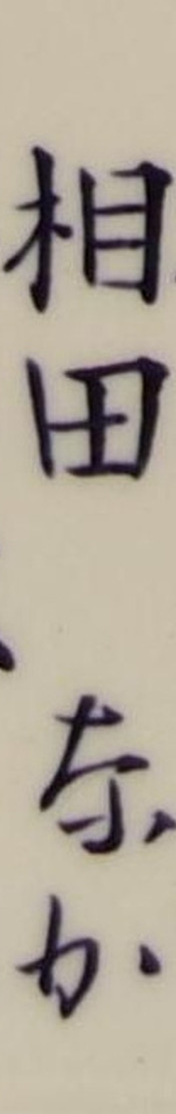相田なか
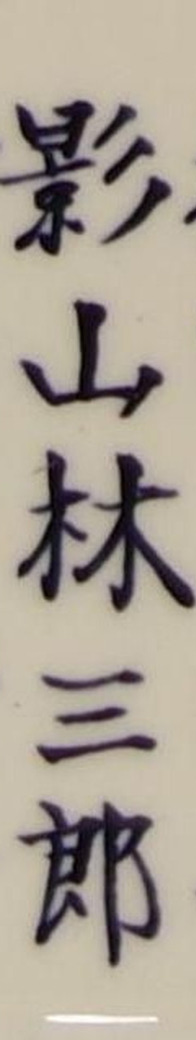影山林三郎
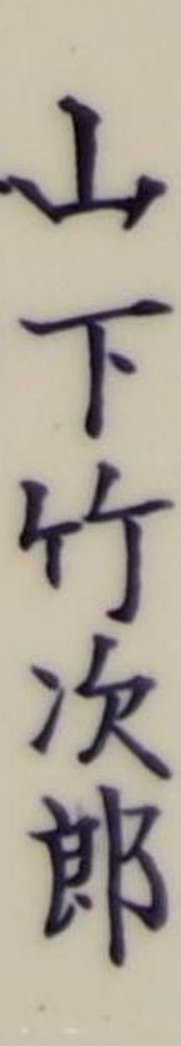山下竹次郎
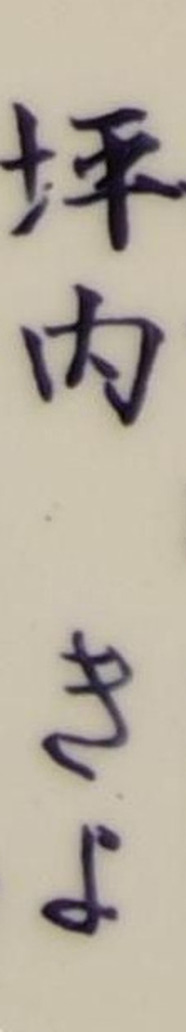坪内きよ
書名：M~S
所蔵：高野山金剛峯寺
